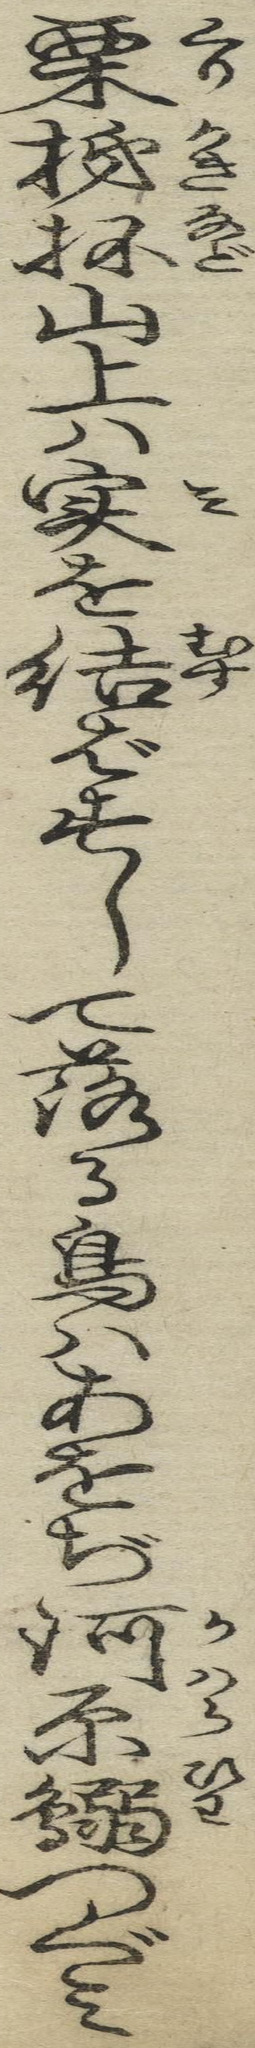栗柿抔山上は実を結ばすして落る鳥はあをぢ河原鶸つぐみ
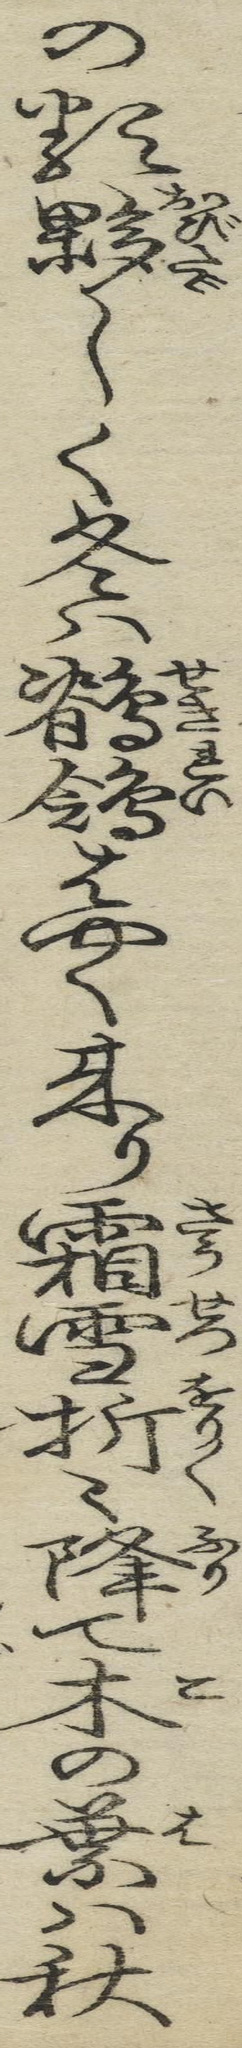の類夥しく冬は鶺鴒はやく来り霜雪折々降て木の葉は秋
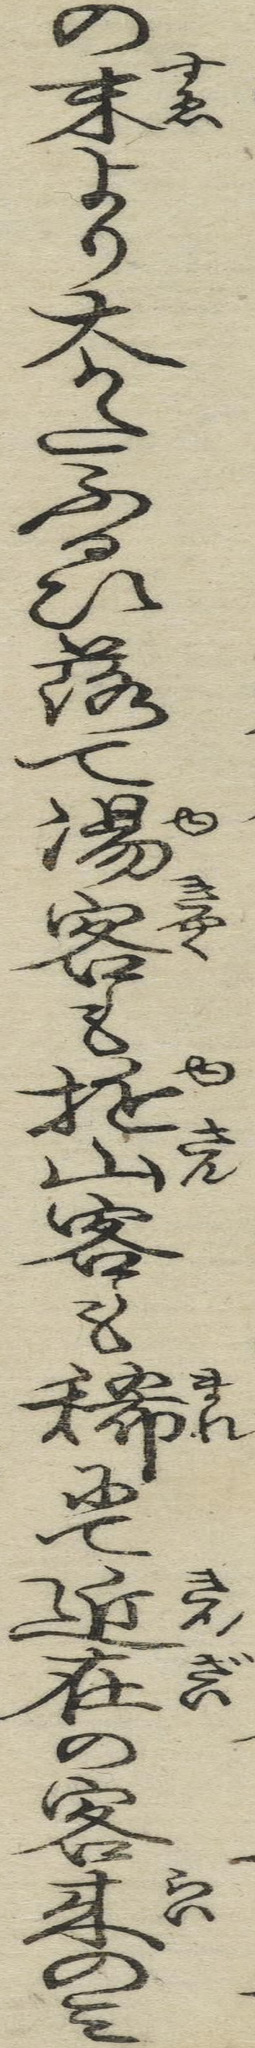の末より大かたふるひ落て湯客も遊山客も稀にて近在の客来のみ
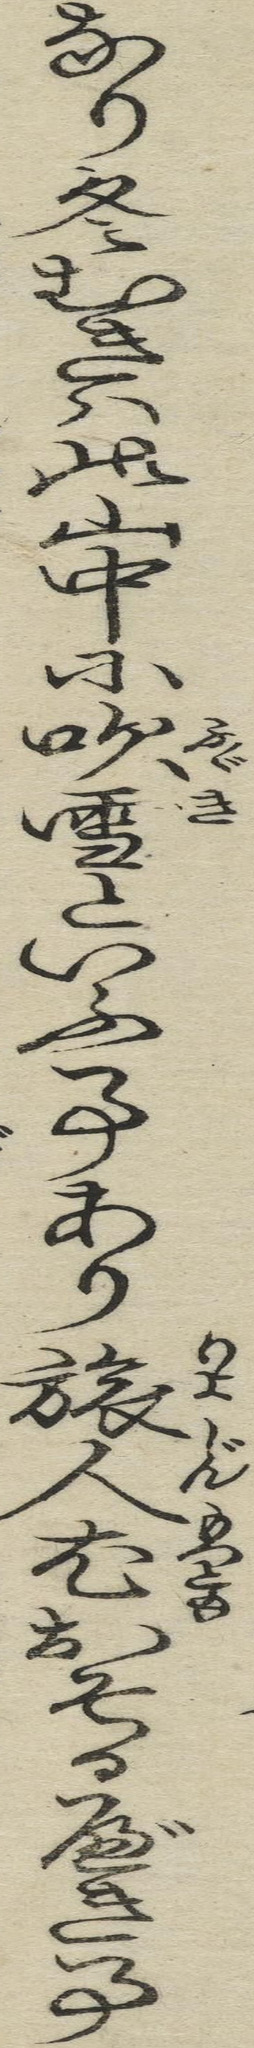なり冬むきは此山中に吹雪といふ事あり旅人尤おそるべき事
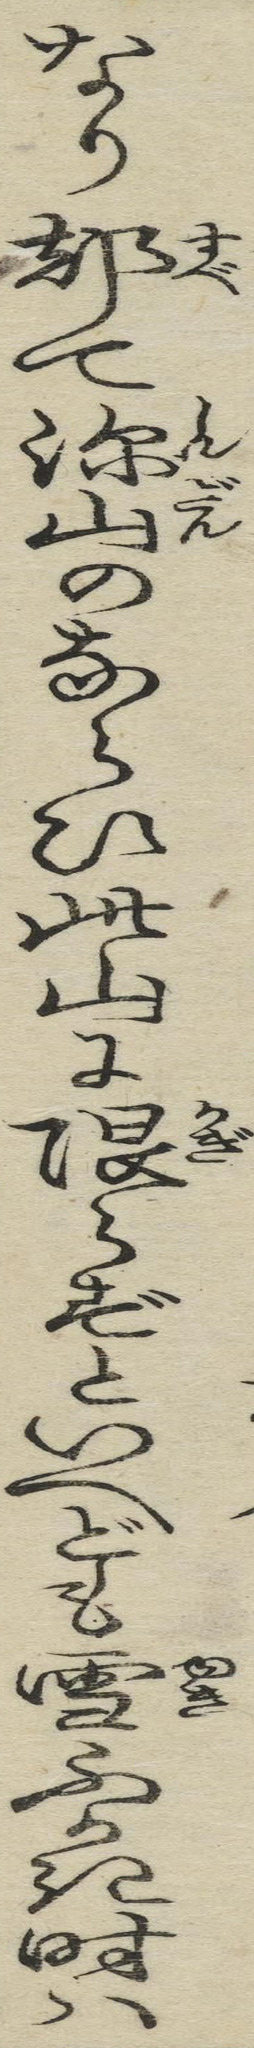なり都て深山のならひ此山に限らずといへども雪ふかき時は
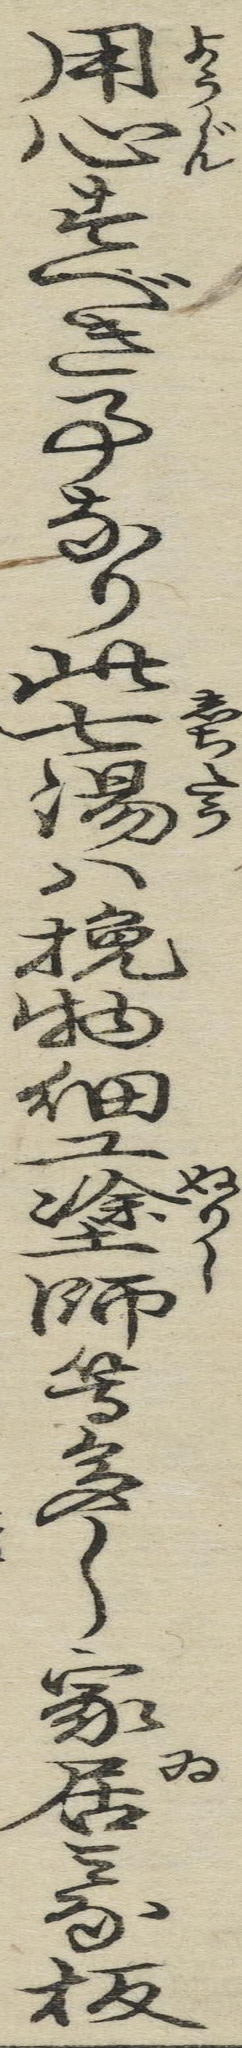用心すべき事なり此七湯は挽物細工塗師等多し家居みな板
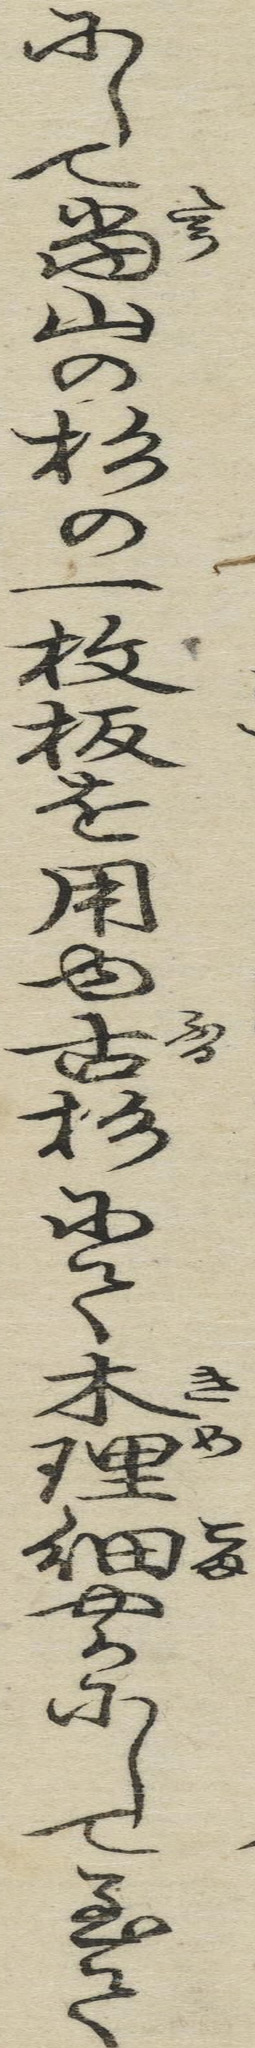にして当山の杉の一枚板を用ゆ古杉にて木理細やかにして至て
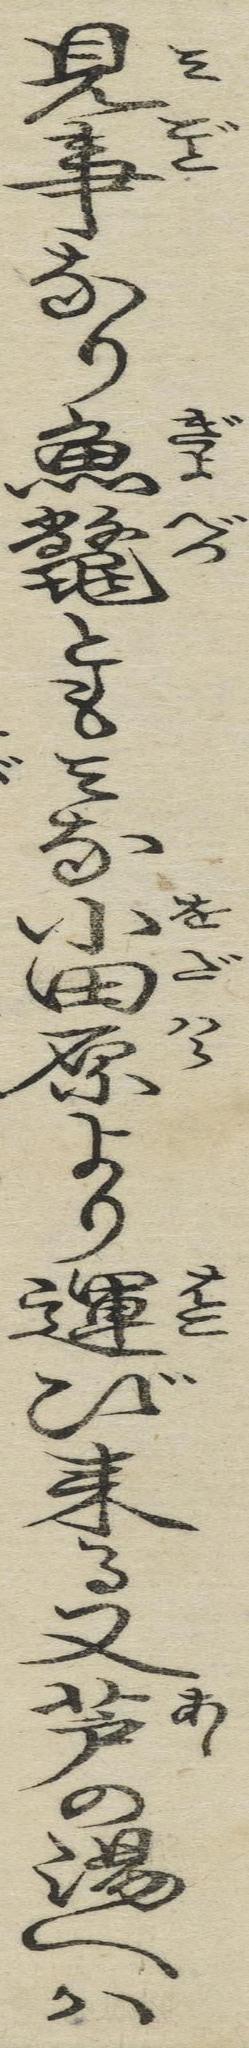見事なり魚鼈ともみな小田原より運び来る又芦の湯へは
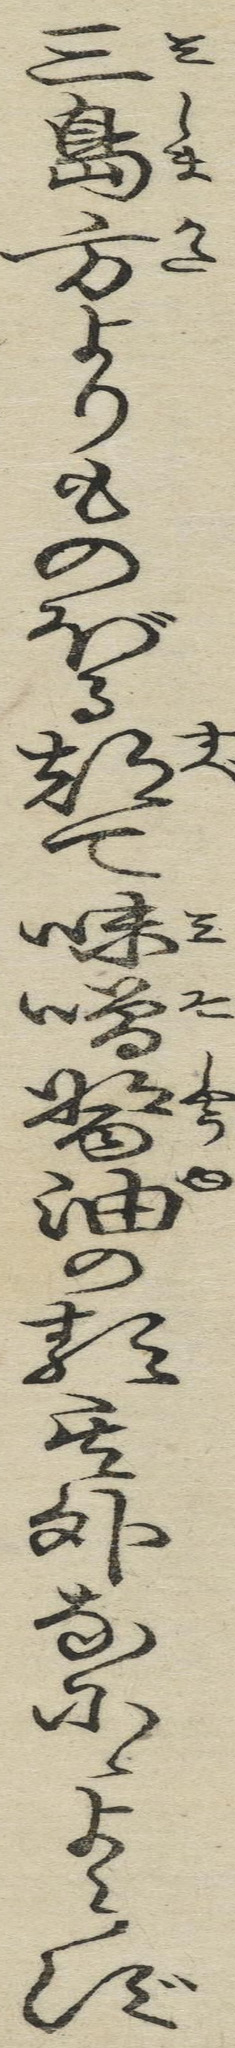三島方よりものぼる都て味噌醤油の類其外なにゝよらず
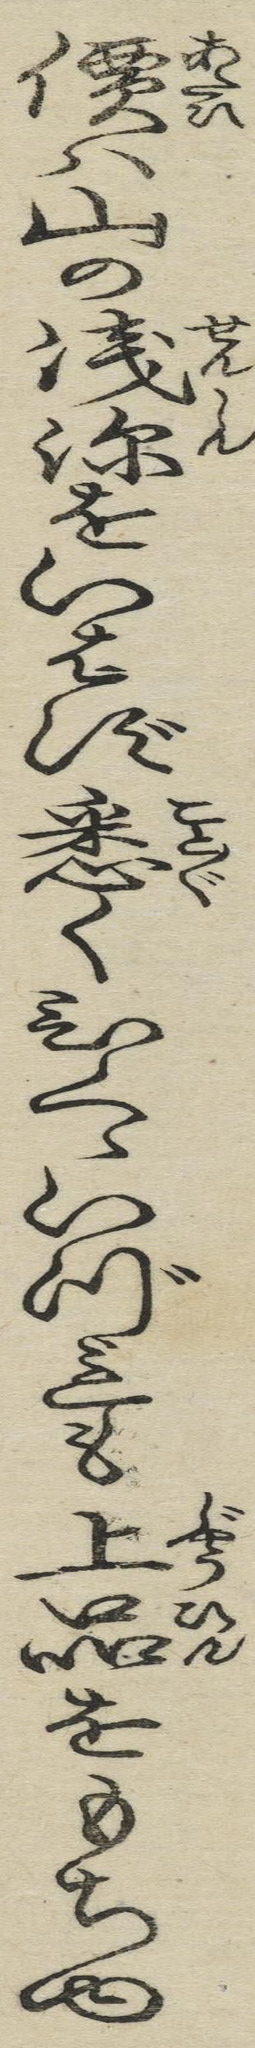値は山の浅深をいはず悉くひくゝいづれも上品をもちゆ
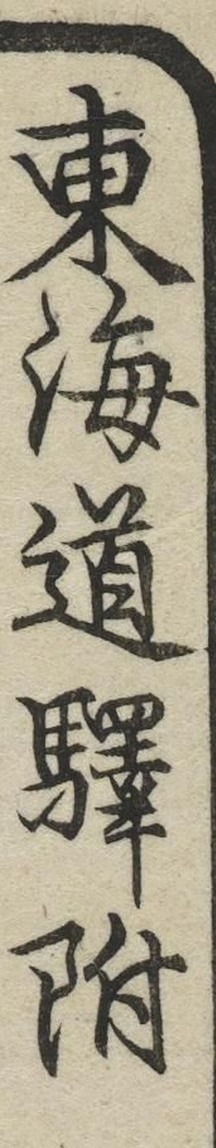東海道駅附
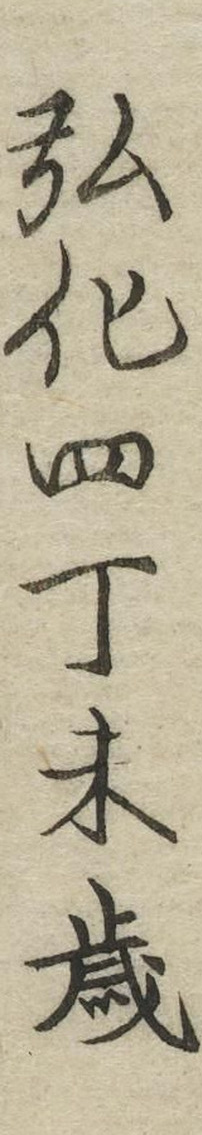弘化四丁未歳
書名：箱根七湯　温泉圖會　全
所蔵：東京大学地震研究所図書室 Earthquake Research Institute Library, The University of Tokyo, JAPAN
